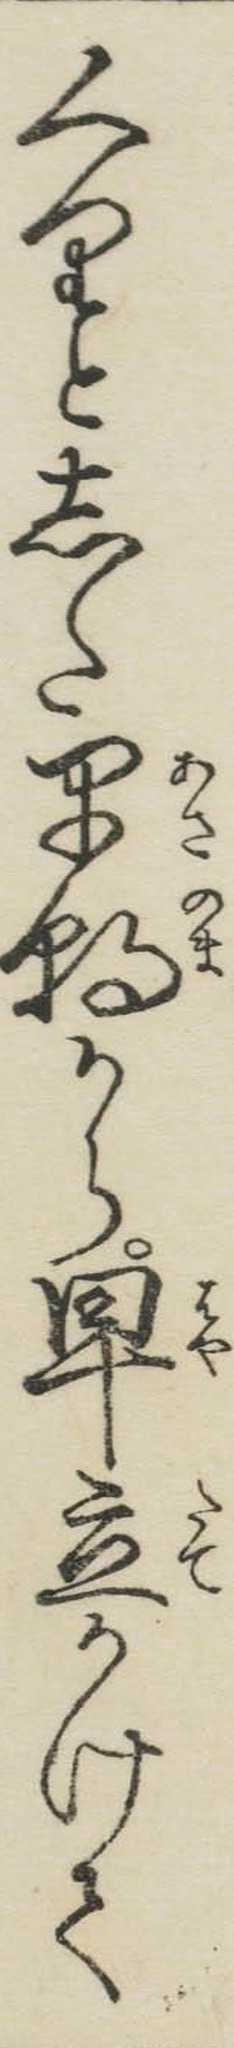くりとした早朝から。早立かけて

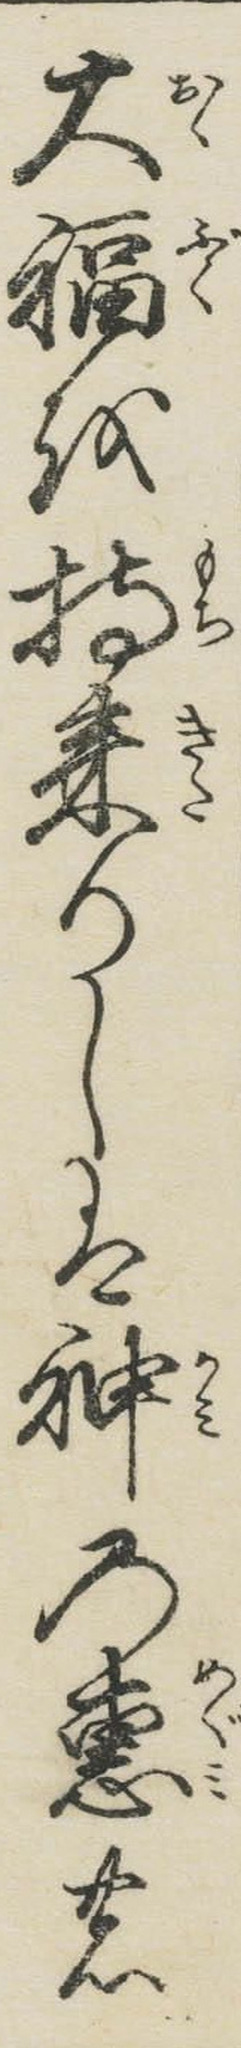大福を持来りしは神の恵の
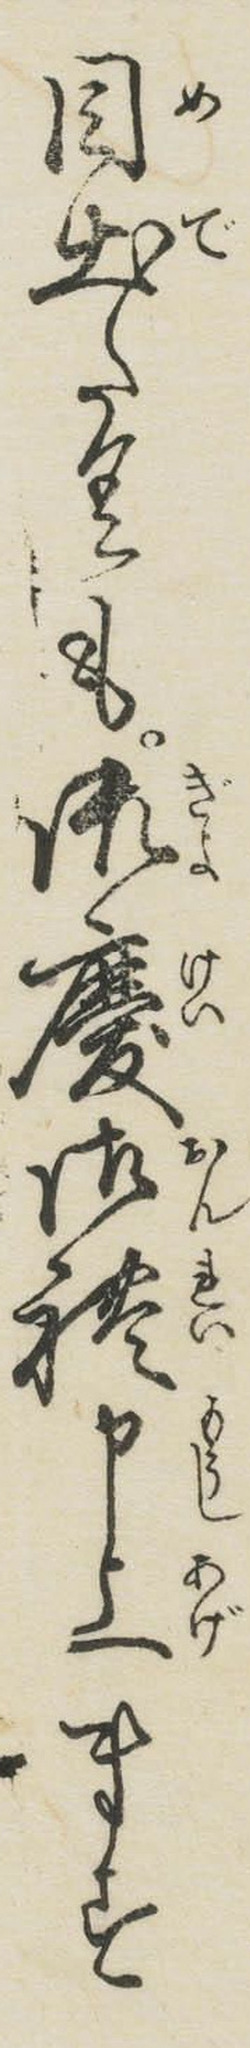目出たくも。御慶御礼申上ます
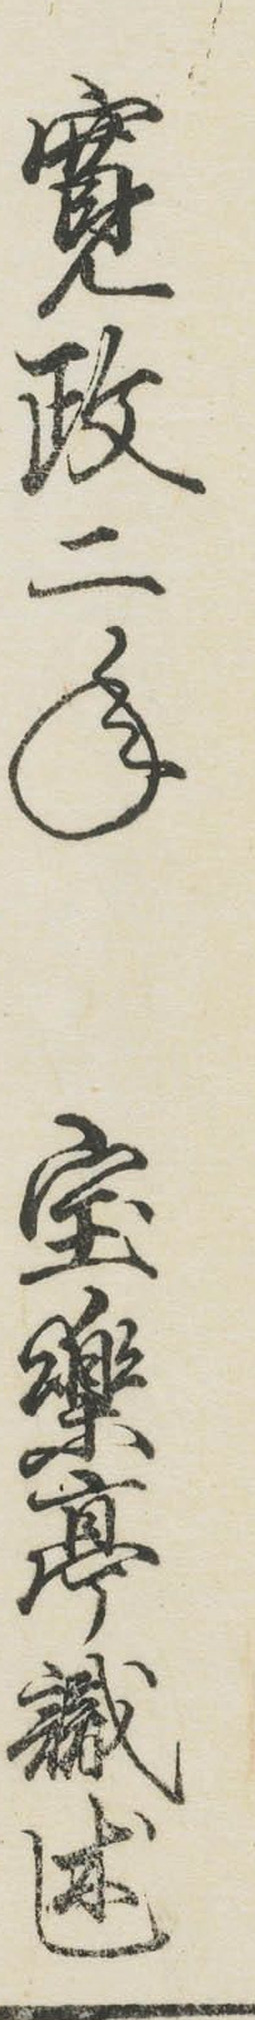寛政二年宝楽亭識述
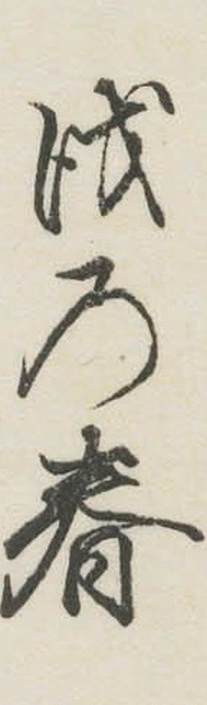戌の春
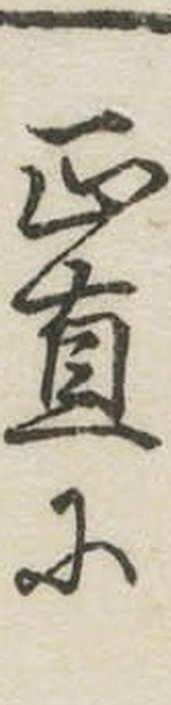正直に
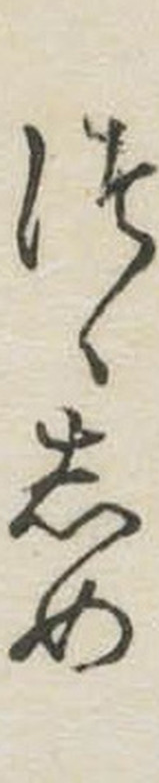つゝしめ
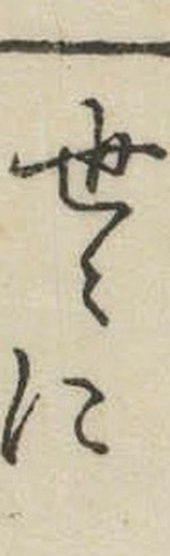世々に
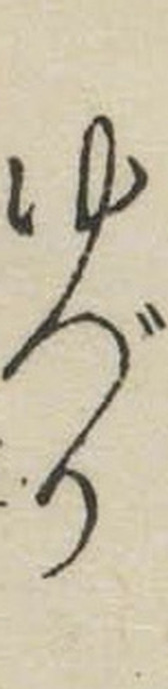ゆづり

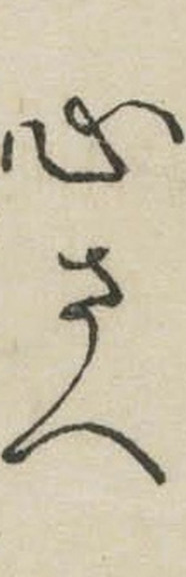心さへ
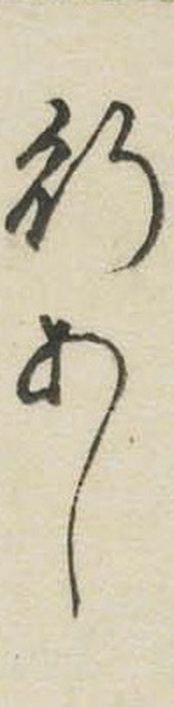行あし
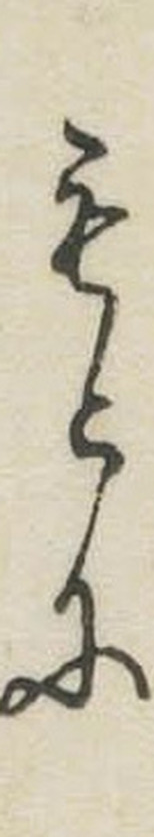もとに
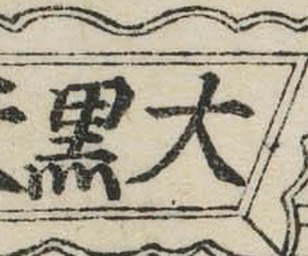大黒天
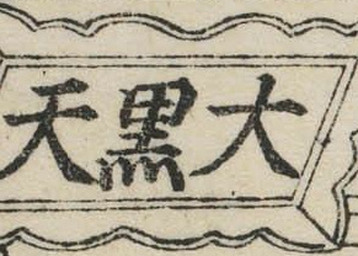大黒天

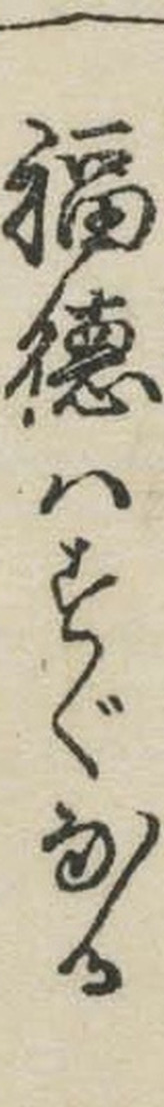福徳はすぐなる
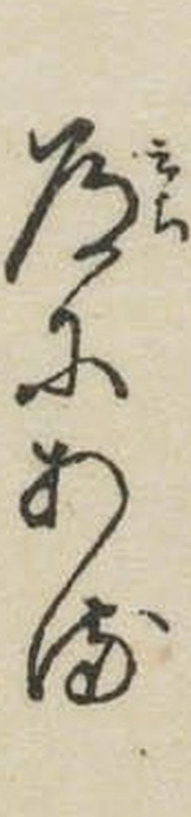道にある
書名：福神おしへの小槌 2巻 上
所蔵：東京学芸大学教育コンテンツアーカイブ
